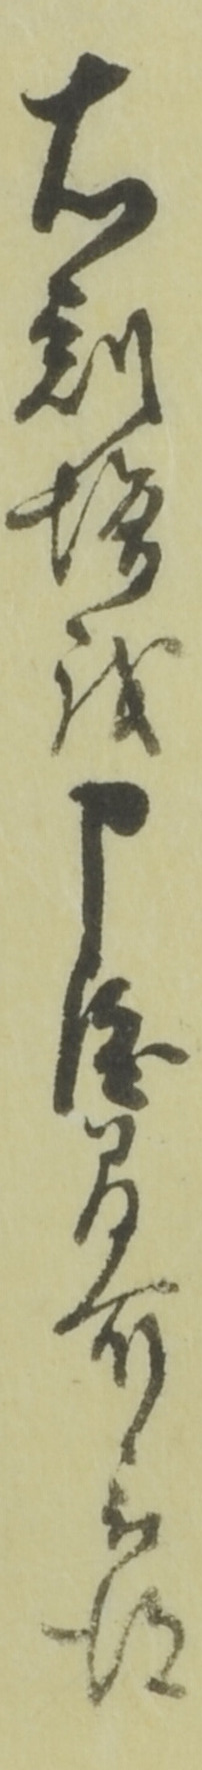右割増儀申渡間可被得
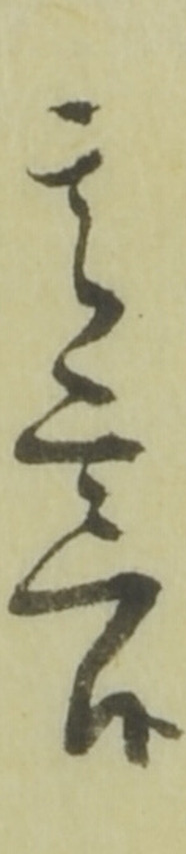其意候
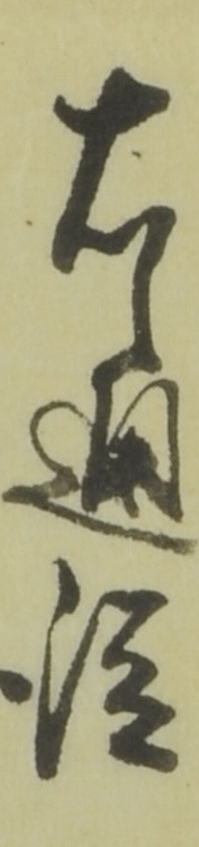右之通従
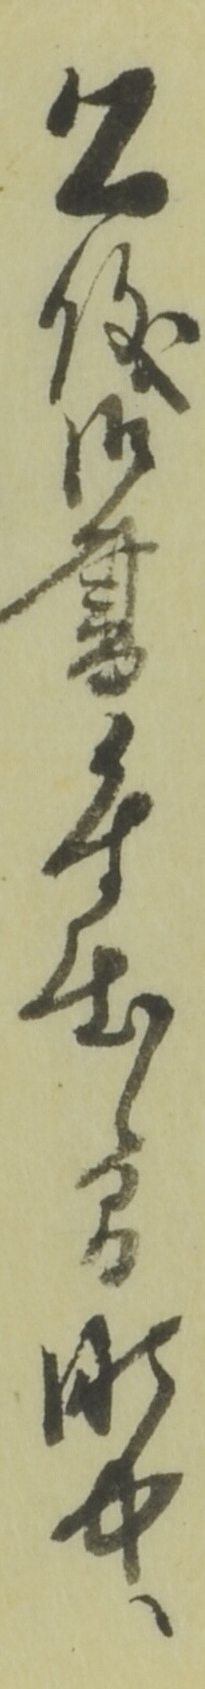公儀御書ニ付候間町中へ
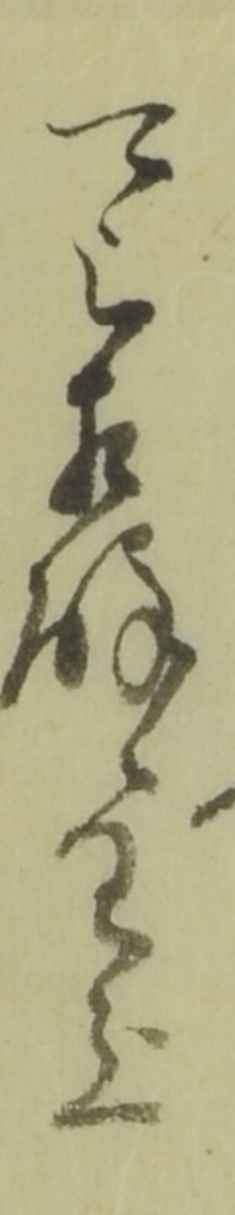可被相触候已上
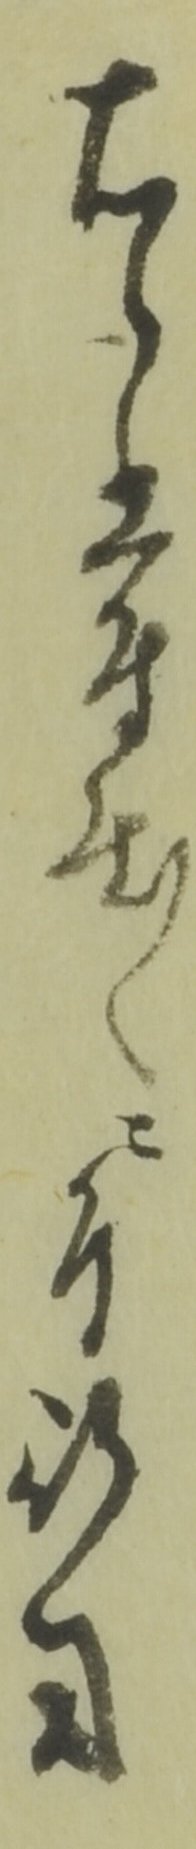右御書付出候ニ付行司
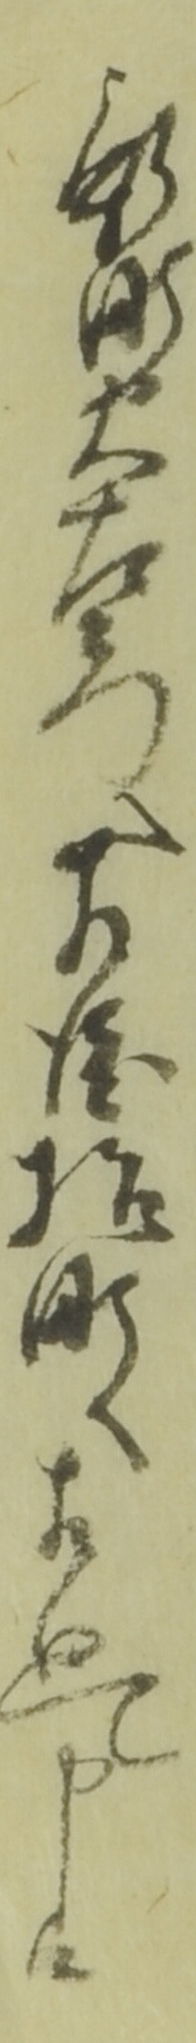新町忠左衛門へ相渡拾町へ相廻シ申候

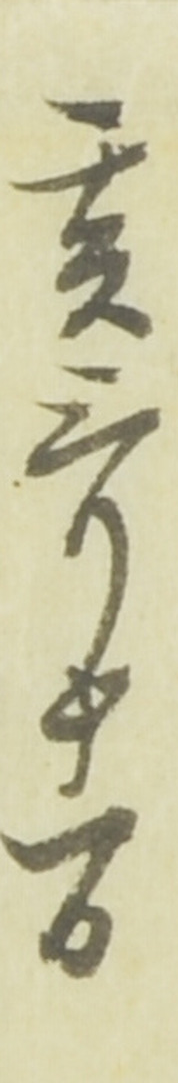亥三月十一日
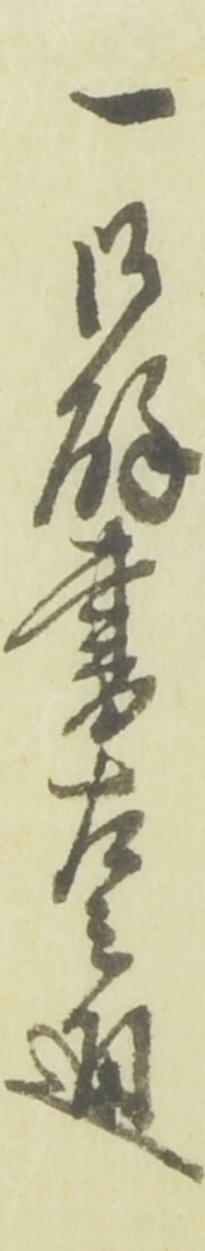一御雇触書左之通
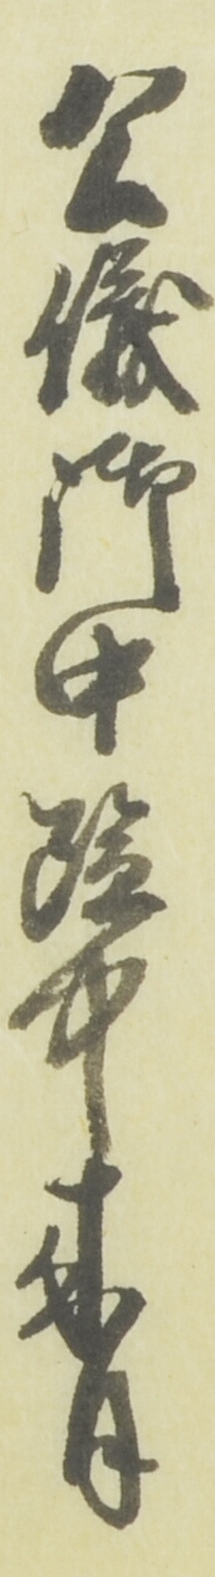公儀御中陰中来月
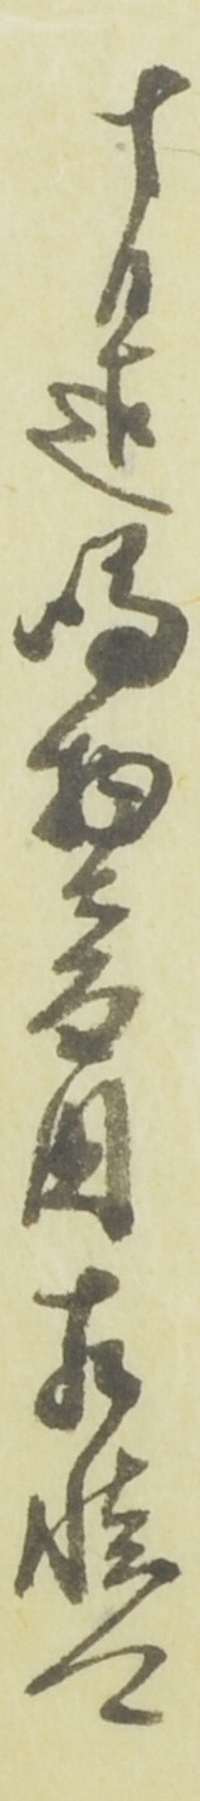十日迄鳴物音曲相慎可
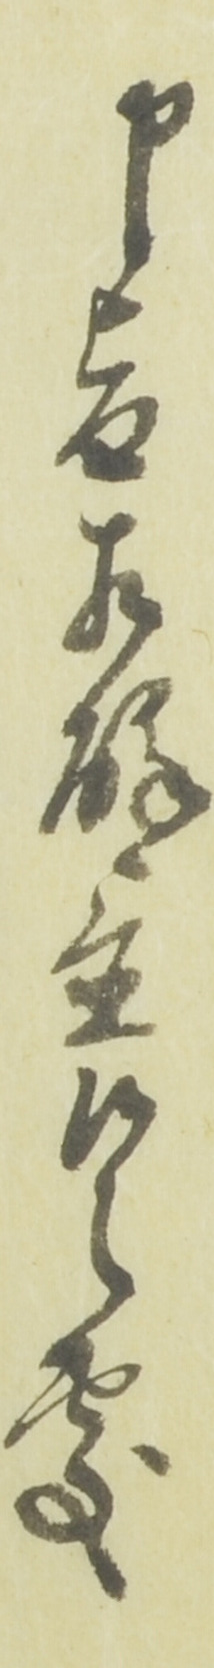申旨相触置候之書
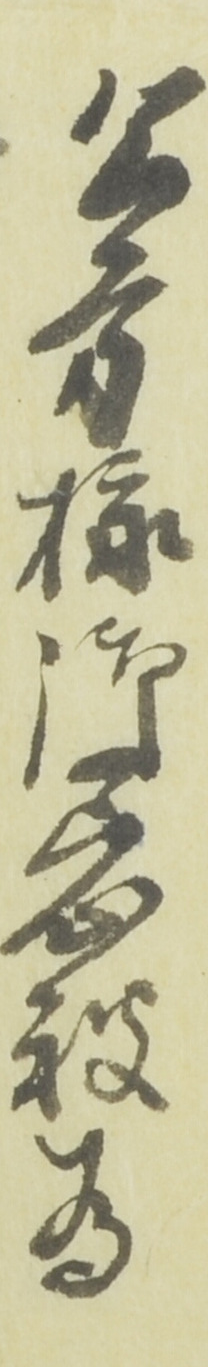公方様御忌被為
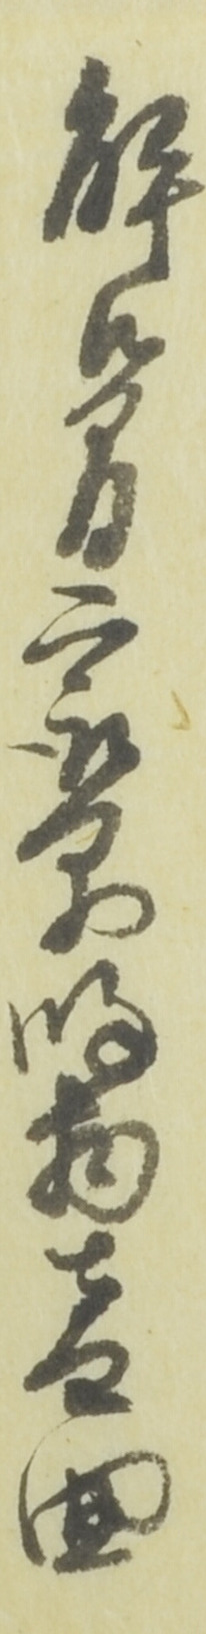解候間最早鳴物音曲
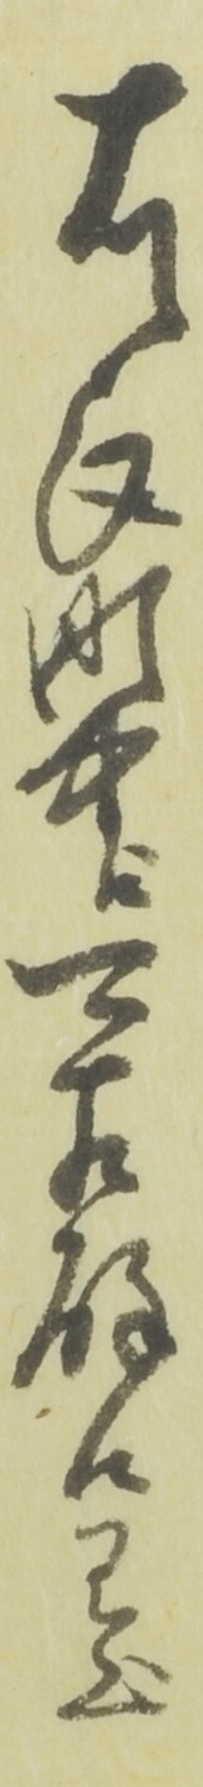右之趣町中江可相触候已上
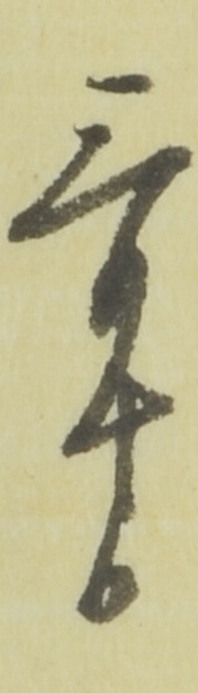三月十日
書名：御触書御書附控
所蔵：伊那市立高遠町図書館・合同会社AMANE
